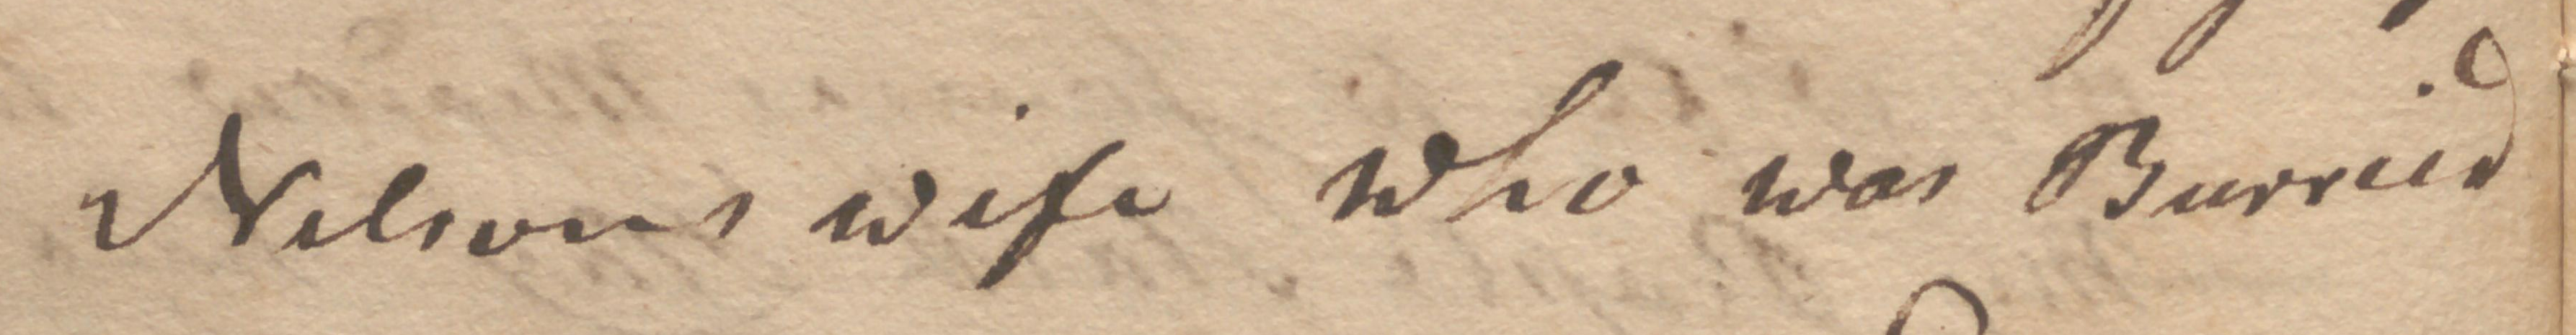Nelsons wife who was Burried
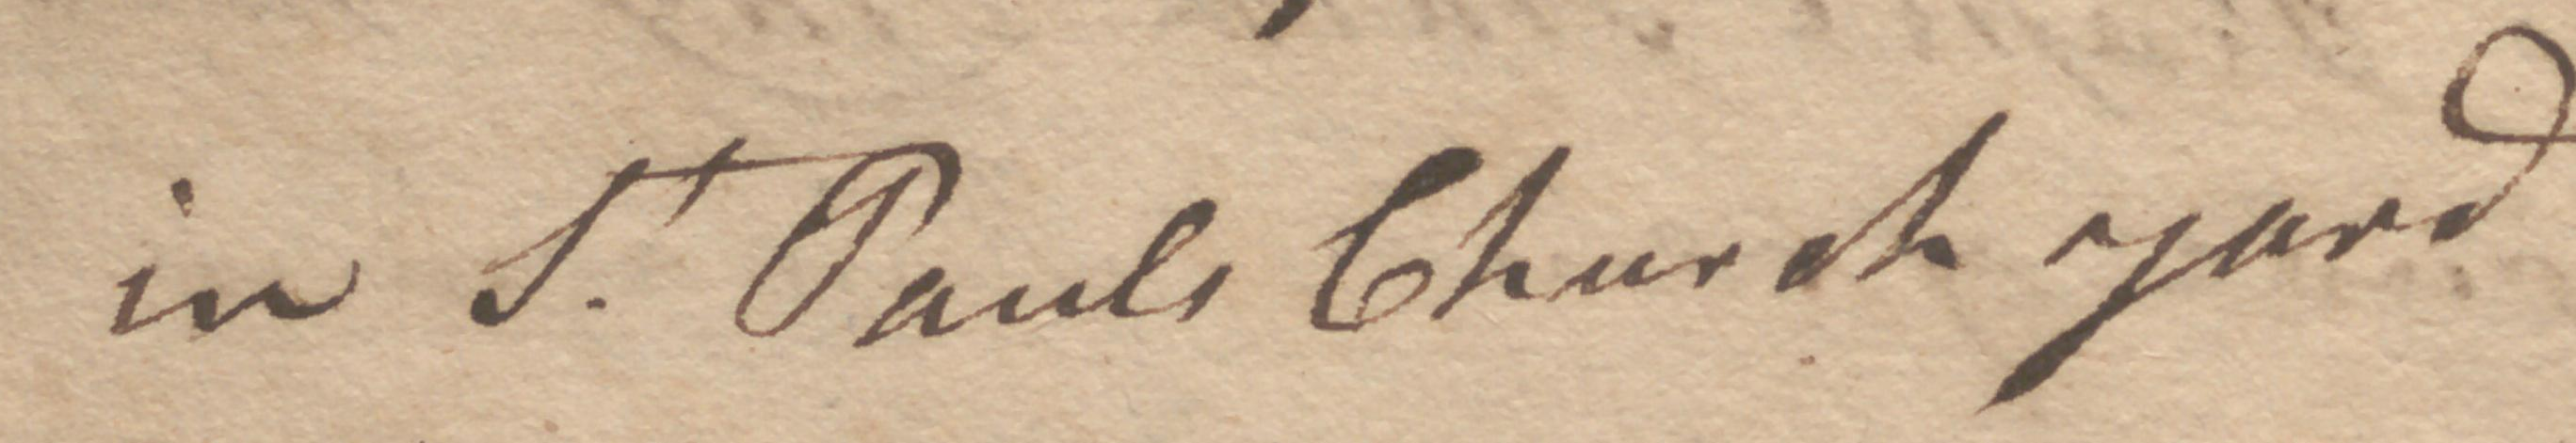in S^t. Pauls Church yard
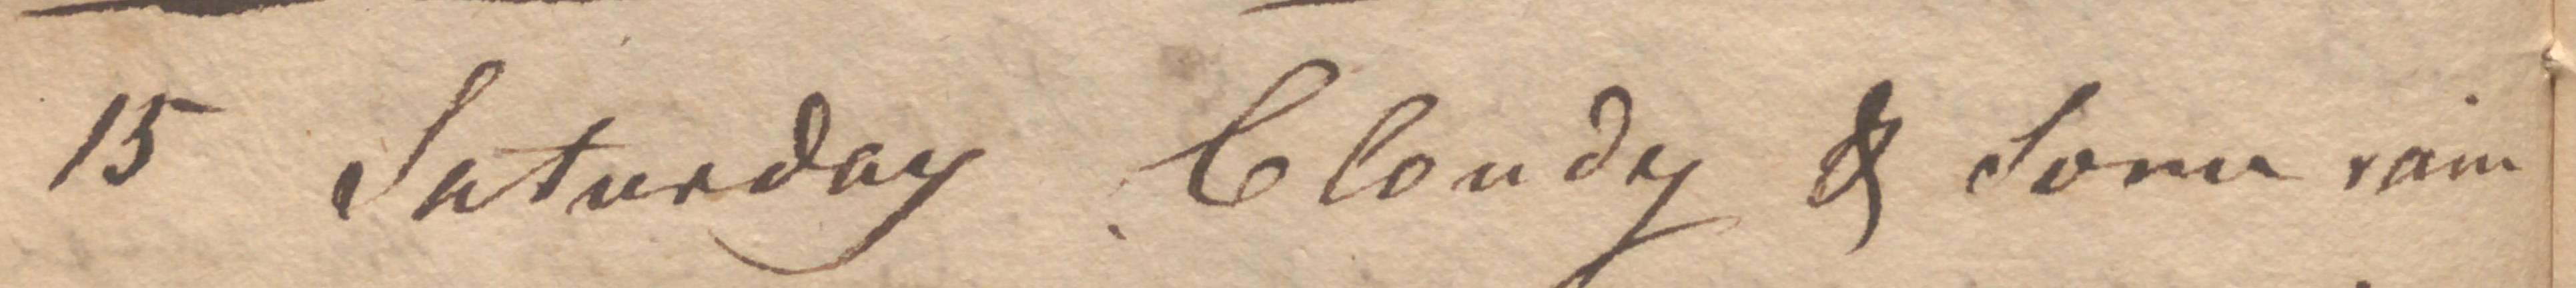15 Saturday Cloudy & some ram
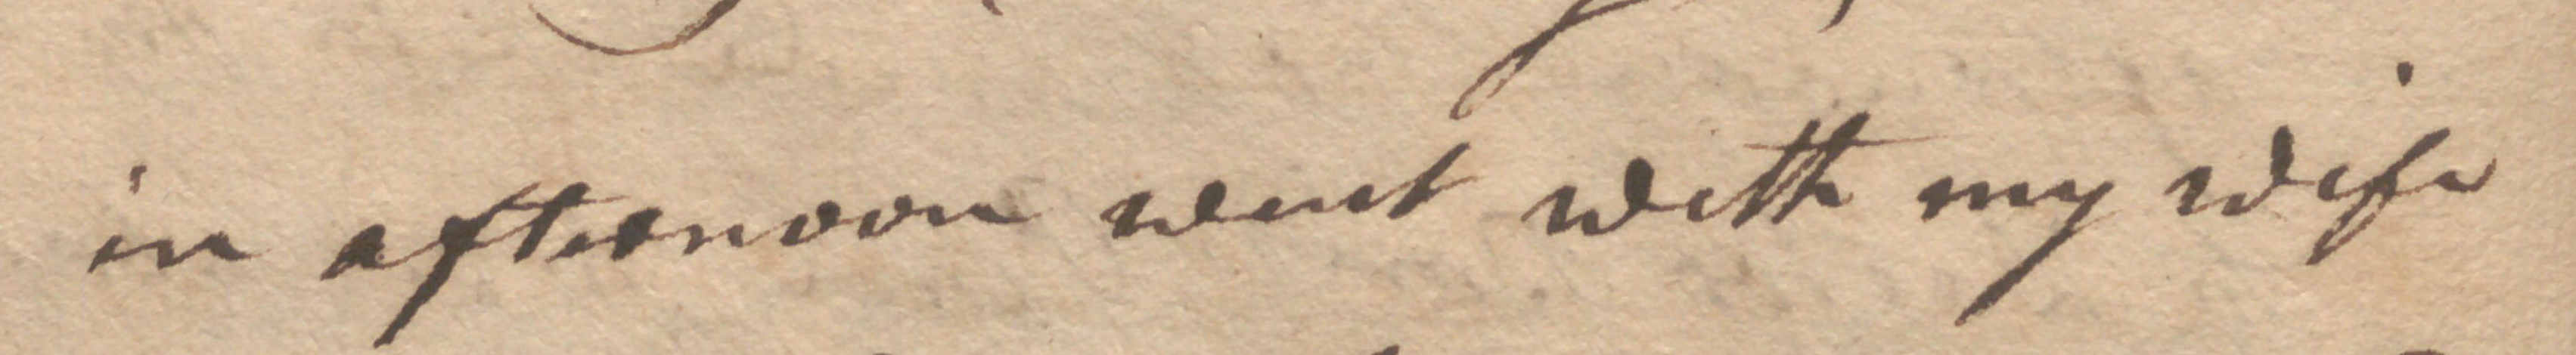in afternoon went with my wife
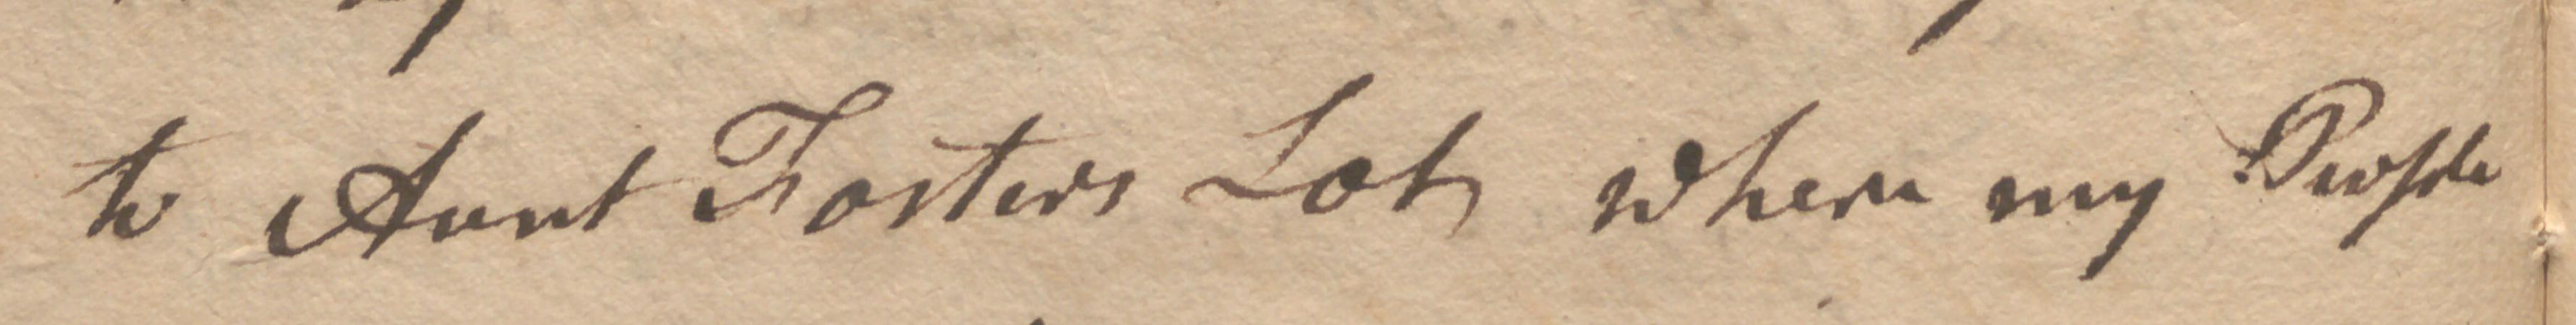to Aunt Fosters Lot where my People
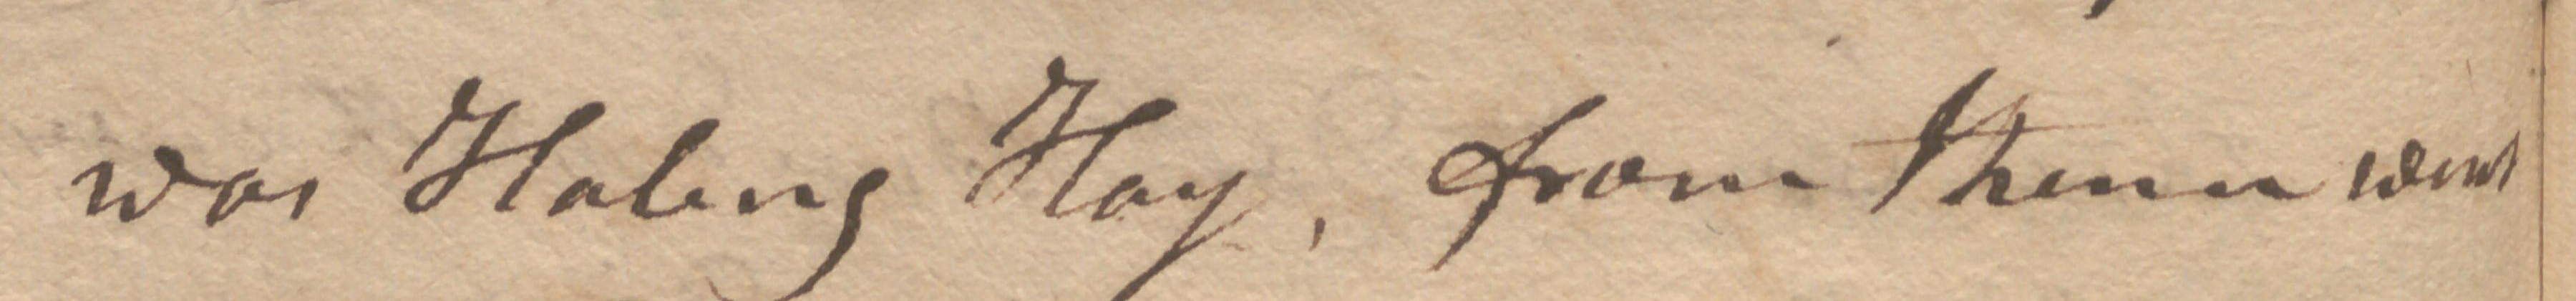was Haling Hay. from thence went
